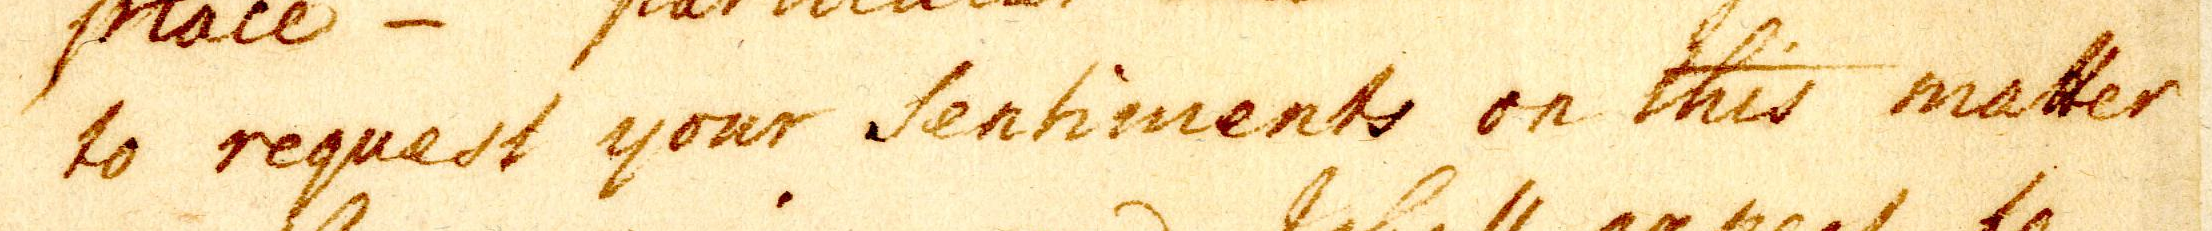to request your Sentiments on this matter
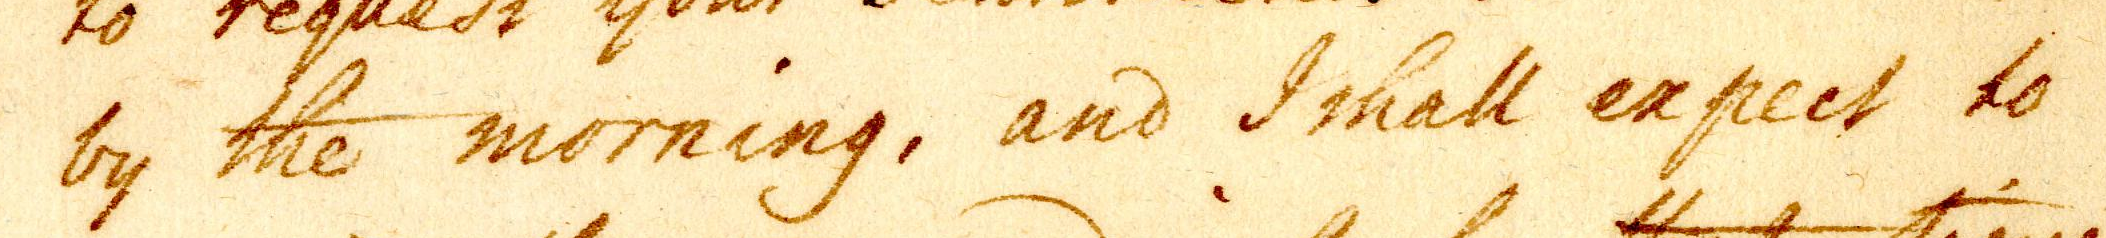by the morning, and I shall expect to
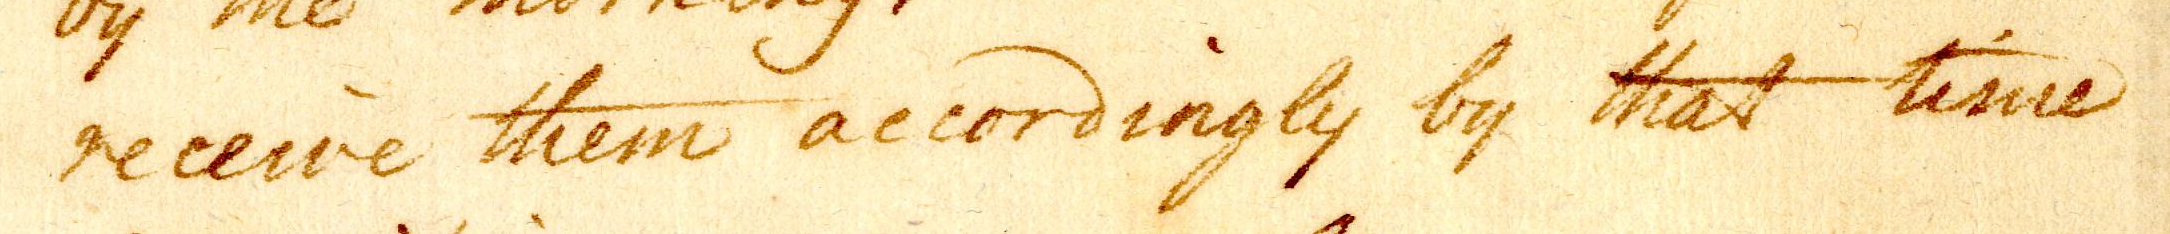receive them accordingly by that time
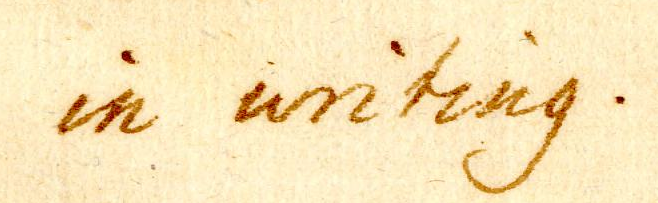in writing.
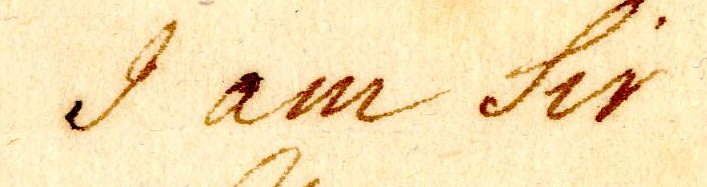I am Sir
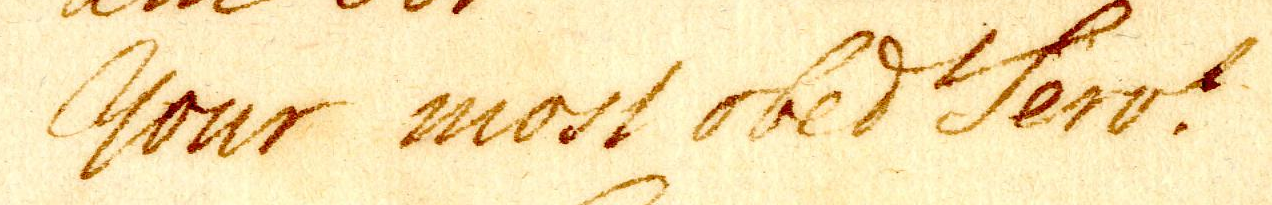your most obed^t Serv^t.
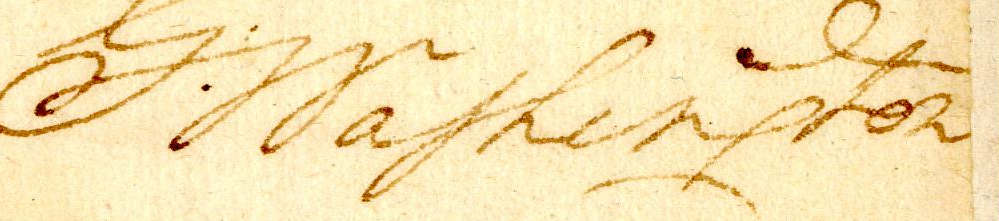G. Washington
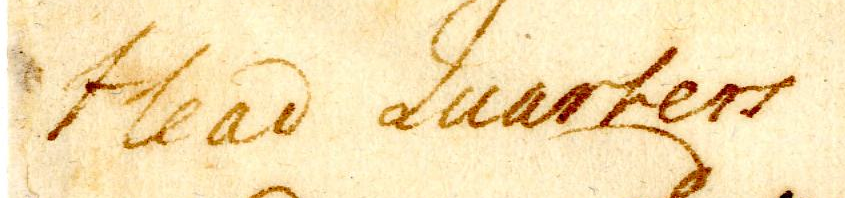Head Quarters
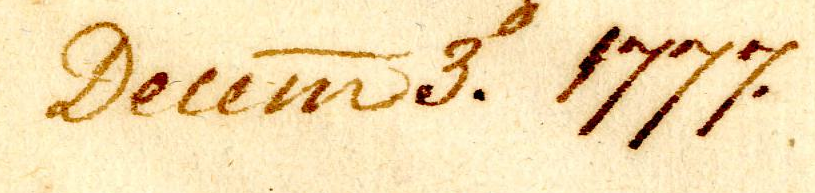Decem 3^d. 1777.
